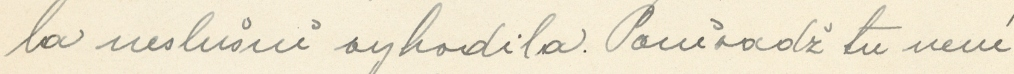la neslušně vyhodila. Poněvadž tu není
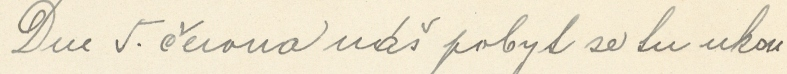Dne 5. června náš pobyt se tu ukon-
